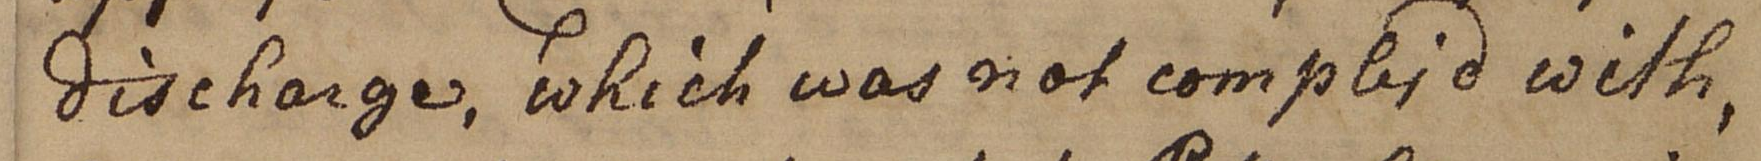discharge, which was not comply'd with,
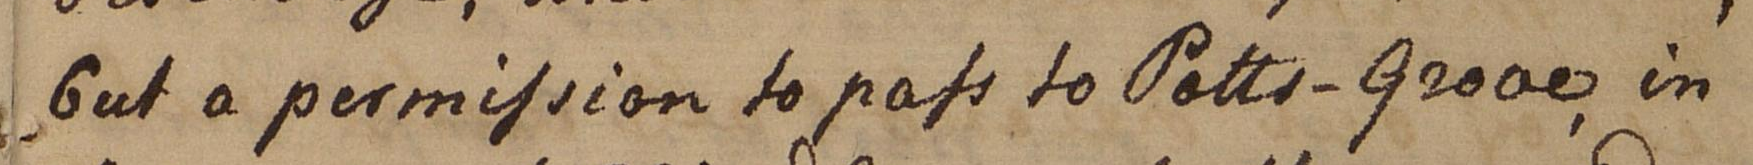but a permission to pass to Potts-Grove, in
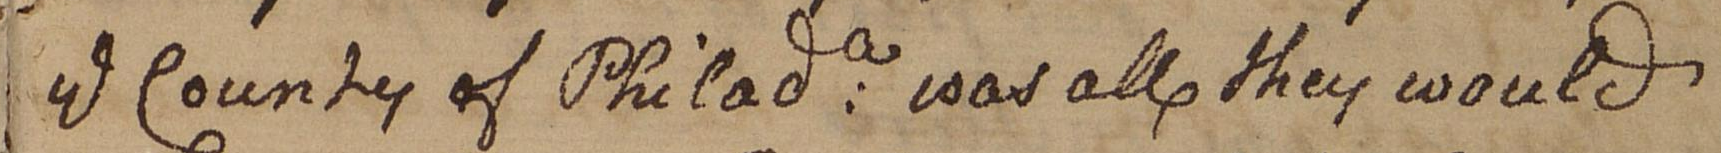y^e County of Philad^a. was all they would
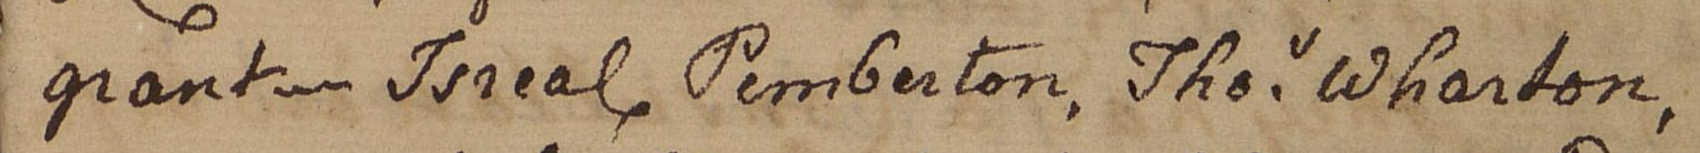grant- Isreal Pemberton, Tho^s. Wharton,
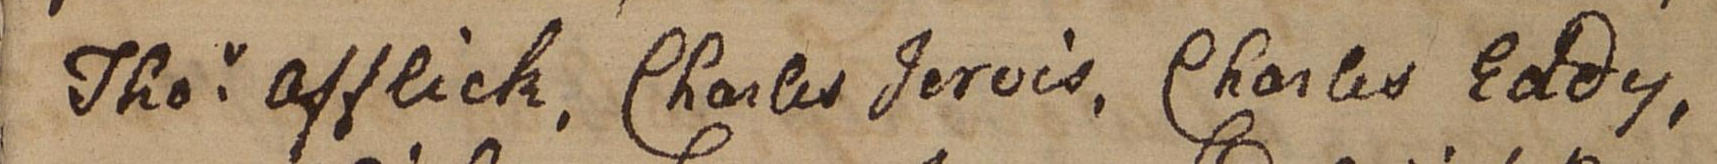Tho^s. Afflick, Charles Jervis, Charles Eddy,
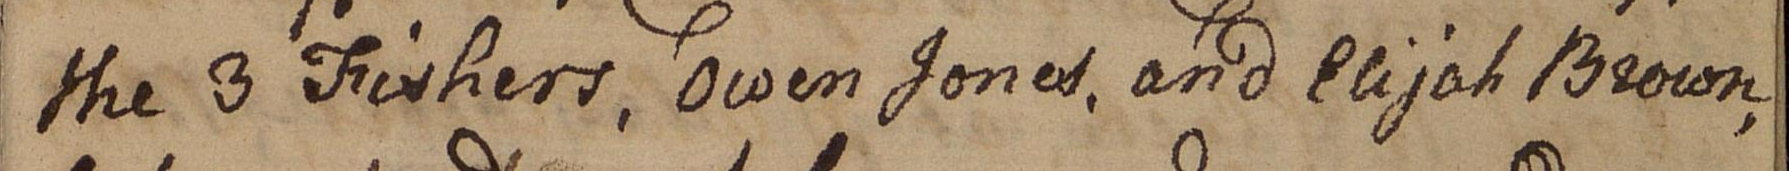the 3 Fishers, Owen Jones, and Elijah Brown,
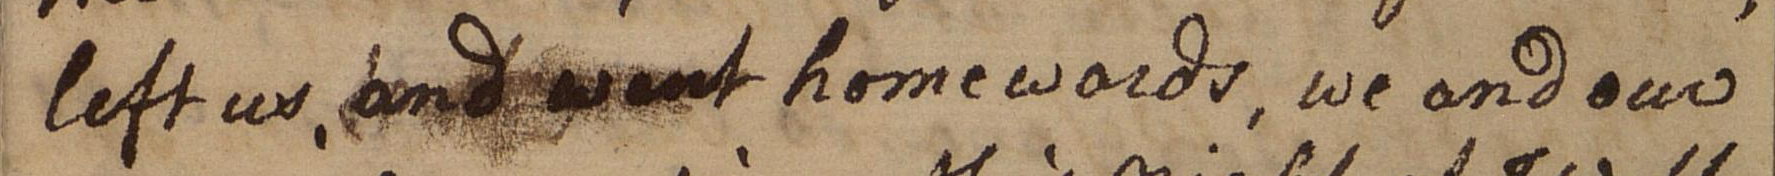left us, and went homewards, we and our
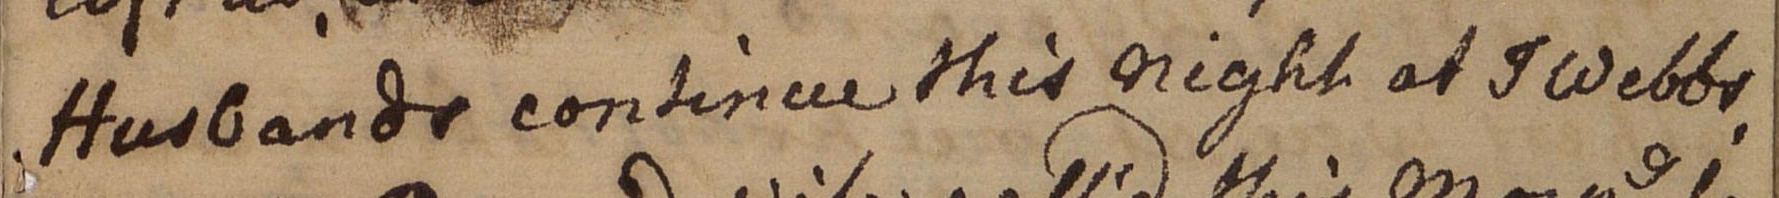Husbands continue this night at T Webbs,
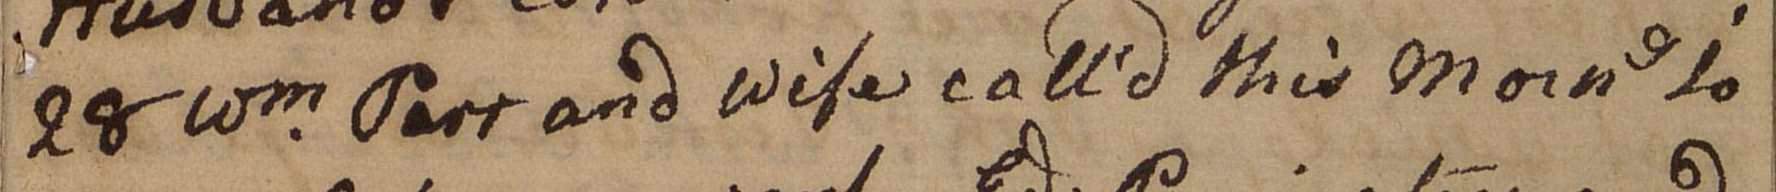28 W^m. Parr and wife call'd this morn^g to
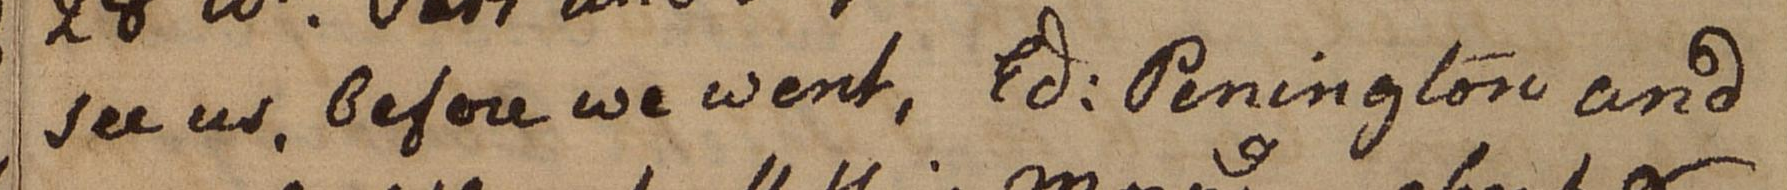see us, before we went,, Ed: Penington and
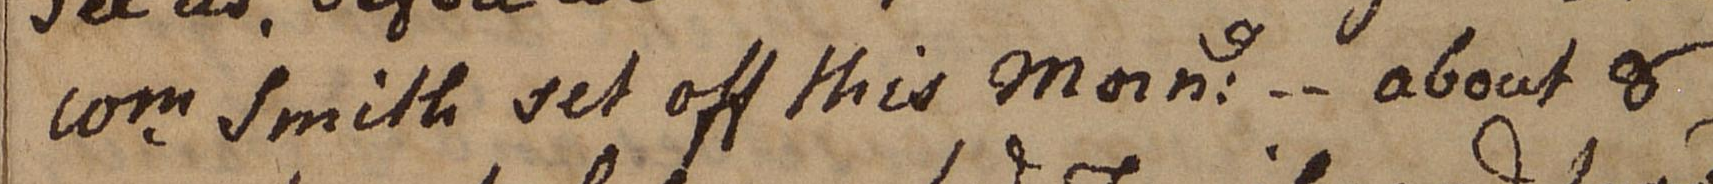W^m. Smith set off this Morn^g:-- about 8
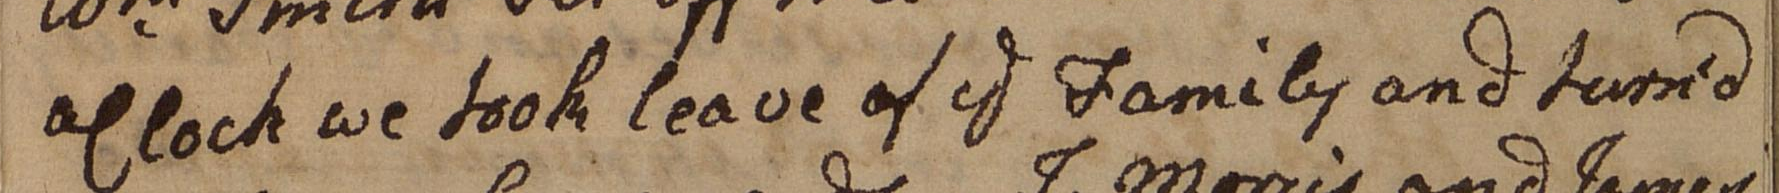^oClock we took leave of y^e Family and turn'd
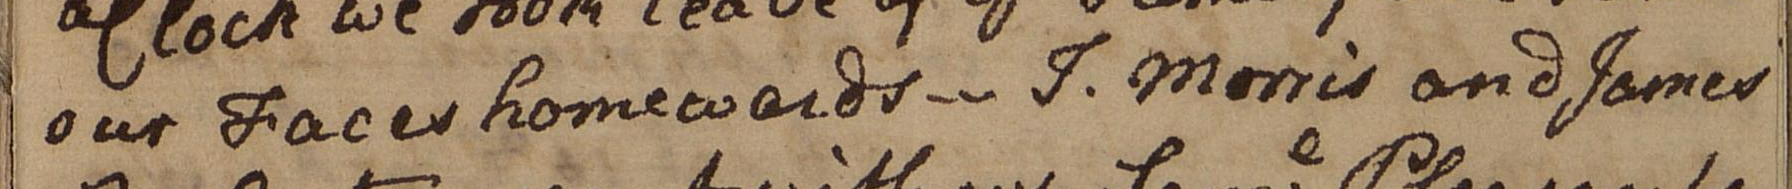our Faces homewards- T. Morris and James
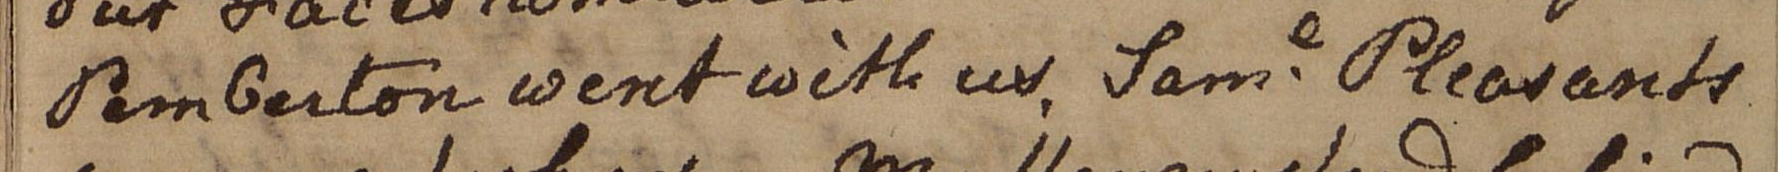Pemberton went with us, Sam^l. Pleasants
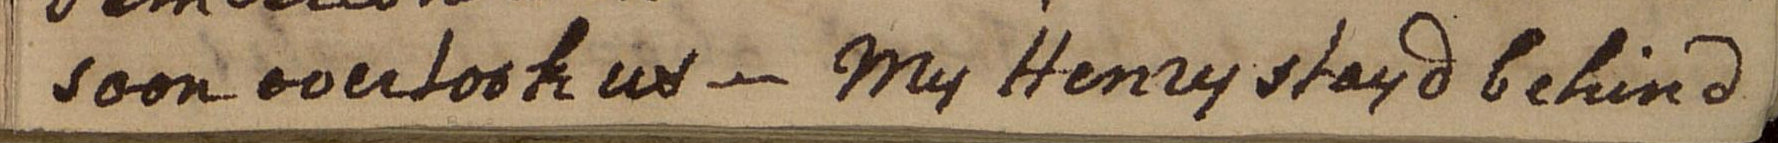soon overtook us- My Henry stayd behind
